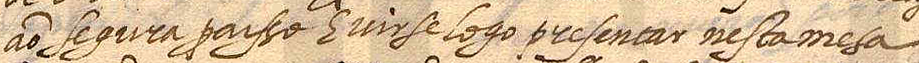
aõ segura ꝑa isso E uirse logo presentar nesta mesa
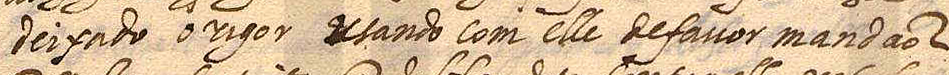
deixado o rigor usando com elle de fauor mandaõ
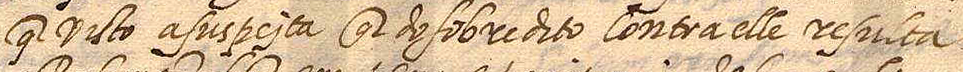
q̄ visto a suspejta q̄ do sobredito contra elle resulta
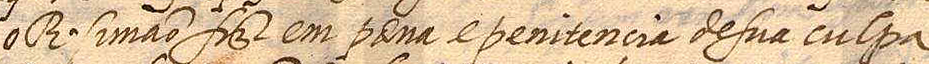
o R. simão frz̄ em pœna e penitencia de sua culpa
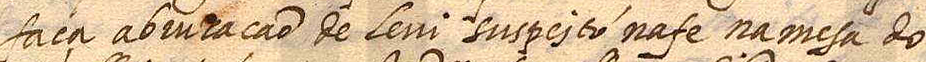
faça abiuraçaõ de leui suspejto na fe na mesa do
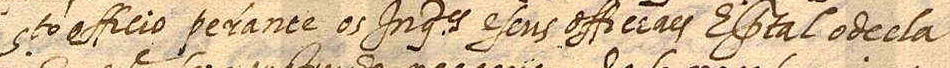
s.to officio perante os Jnq.res e seus officiaes E p̄ tal o decla
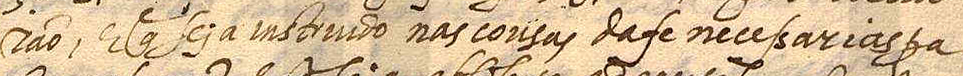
raõ, E q̄ seja instruido nas cousas da fe necessarias ꝑa
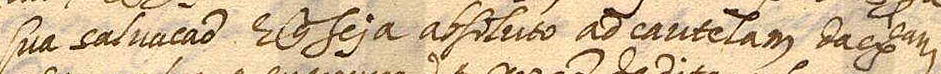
sua saluaçaõ E q̄ seja absoluto ad cautelam da excam
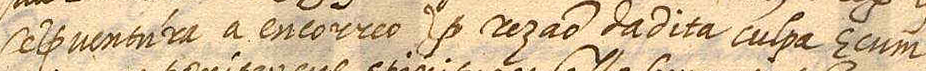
se p̄uentura a encorreo p̄ rezaõ da dita culpa E cum
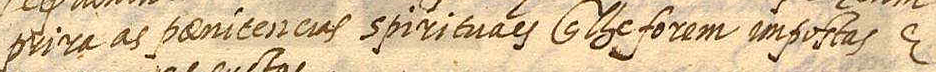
prira as pœnitencias spirituaes q̄ lhe forem impostas E
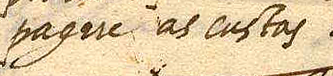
pague as custas.
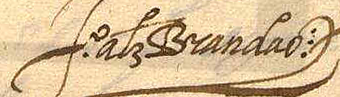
J.o al̄z Brandaõ
